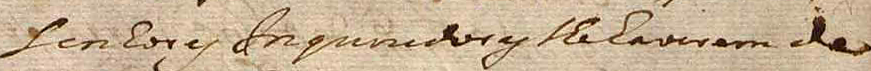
senhores Inquizidores lhe haverem de
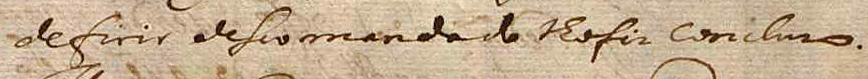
defirir de seo mandado lho fiz concluzo.
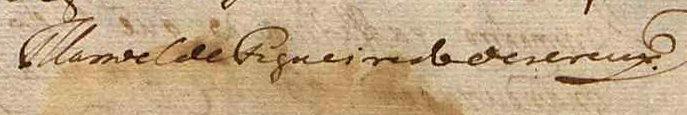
Manoel de Figueiredo o escreuy.
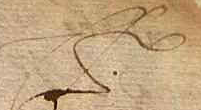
CL.o
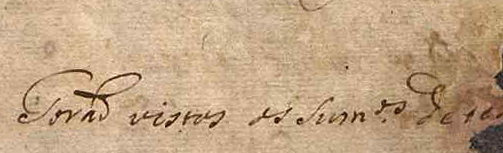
Foraõ vistos os sum.os de
